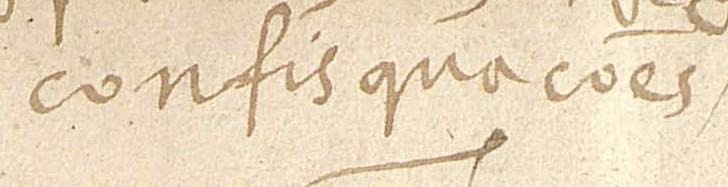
confisquações
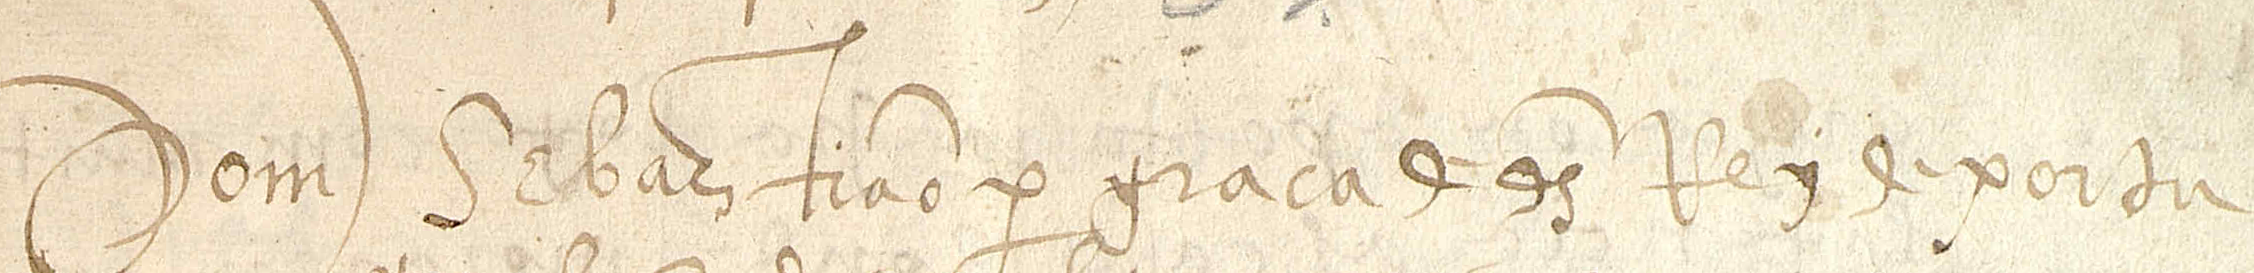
Dom Sebastião ꝑ graça de ds̄ Rey de portu
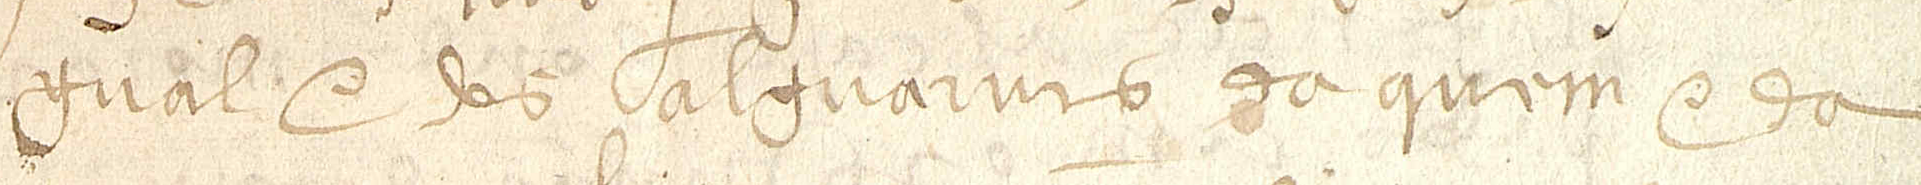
gual e dos alguarues daquem e da
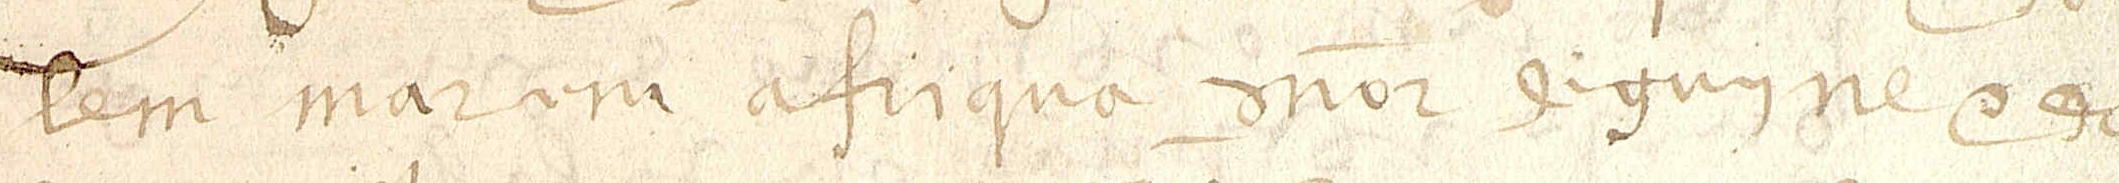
lem mar em afriqua sn̄or de guyne e da
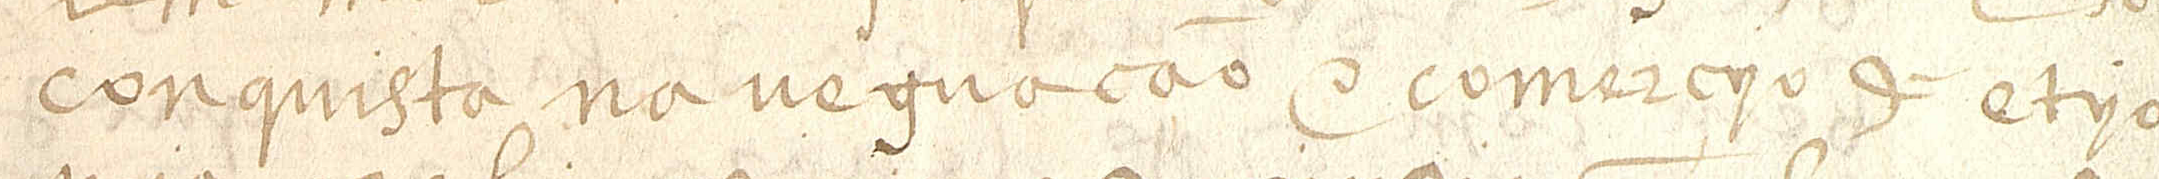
conquista naueguação e comercyo de etyo
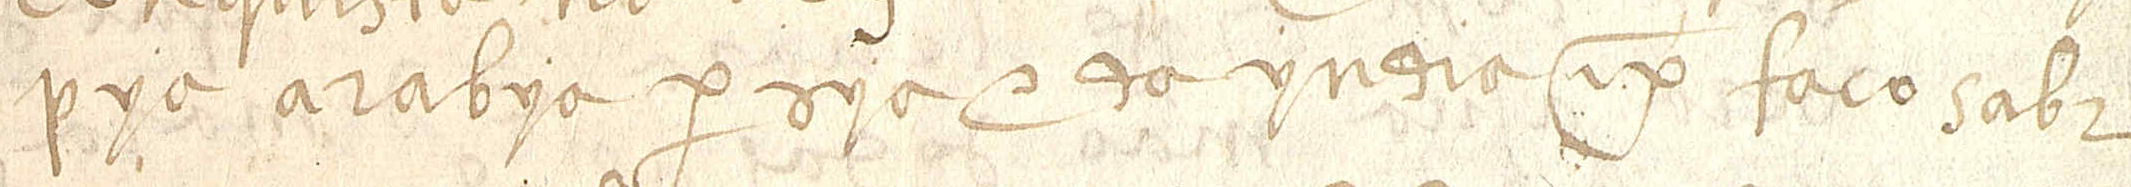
pya arabya ꝑsya e da yndia c̄ꝭ faço sabr
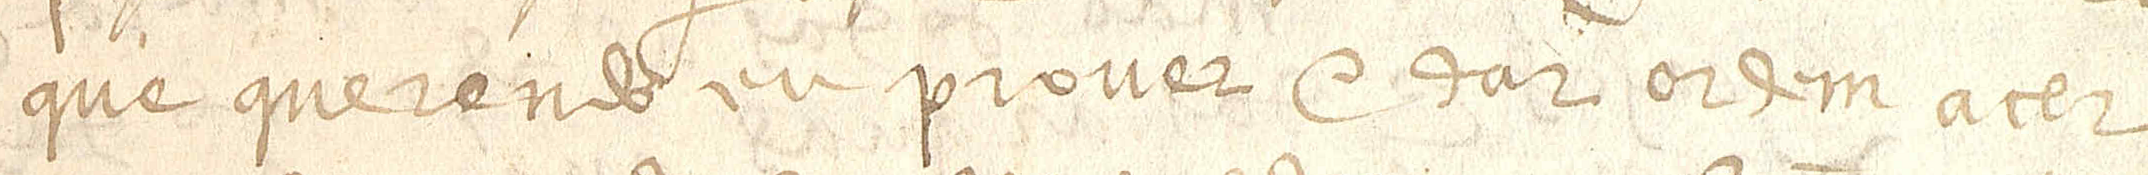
que querendo eu prouer e dar ordem acer
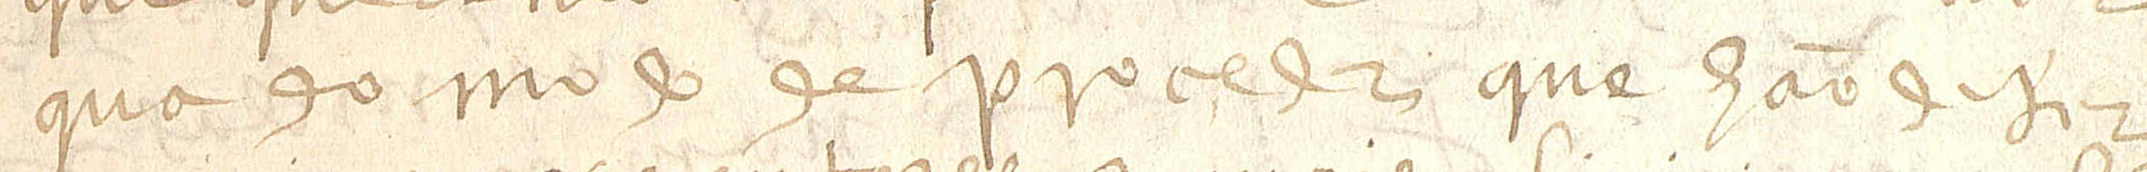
qua do modo de proceder que hão de ter
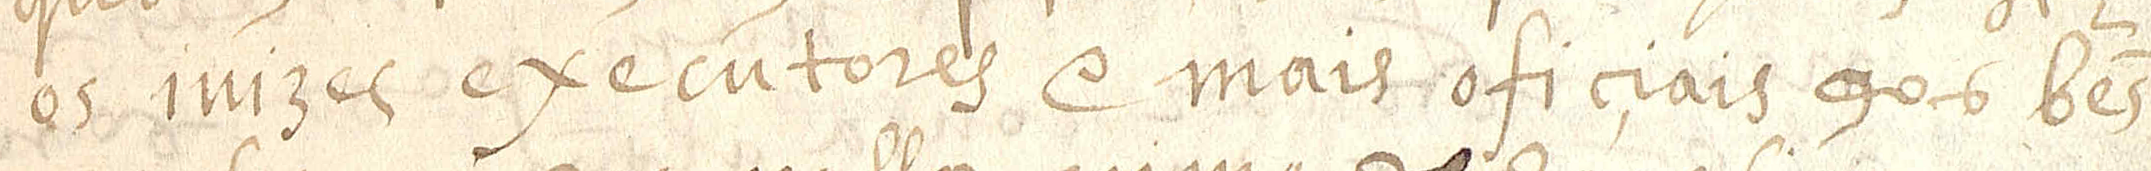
os iuizes executores e mais oficiais dos bēs
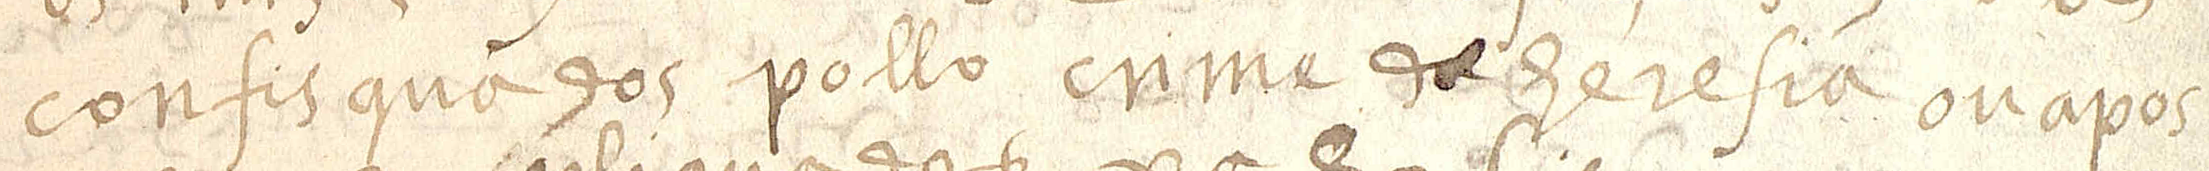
confisquados pollo crime de heresia ou apos
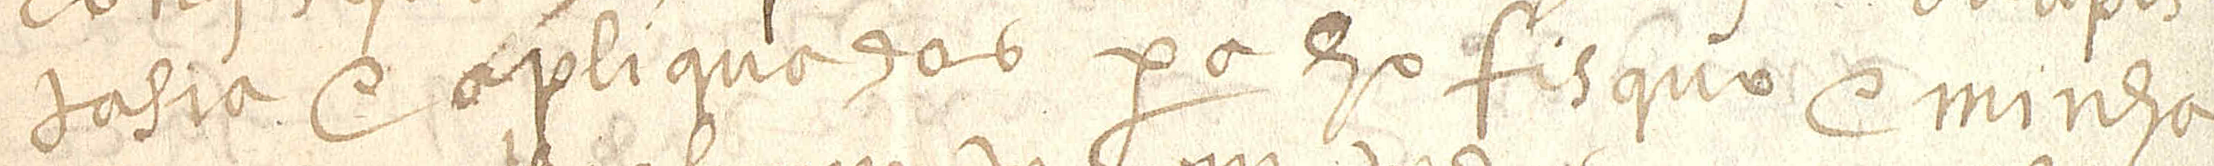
tasia e apliquados ꝑa ho fisquo e minha
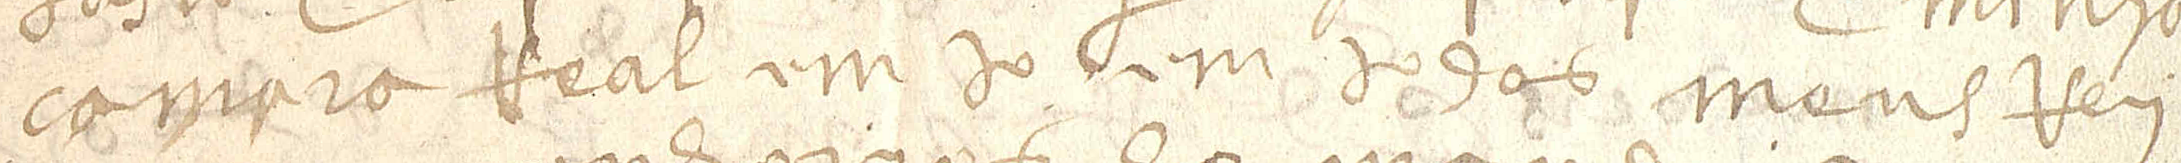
camara Real em to em todos meus Rey
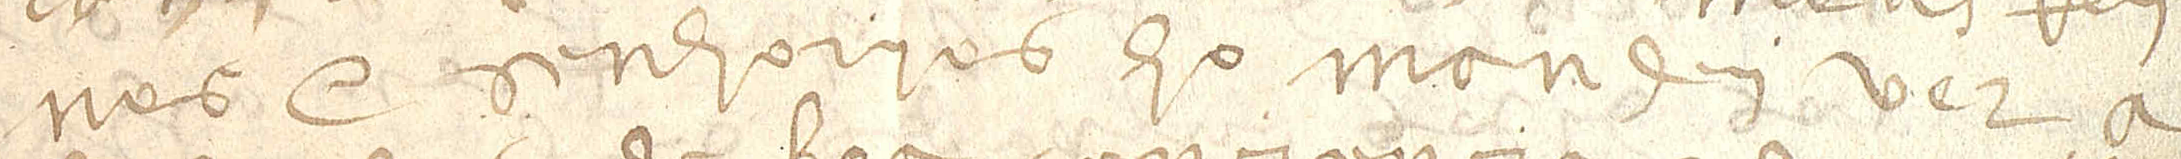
nos e senhoryos ho mandey ver a
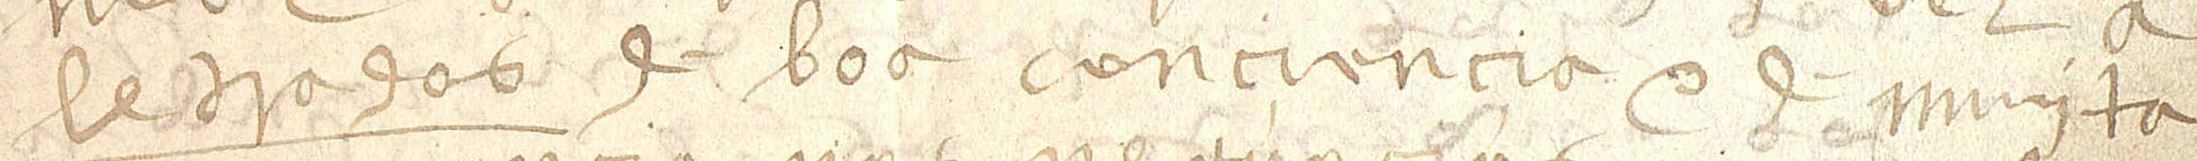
letrados de boa conciencia e de muyta
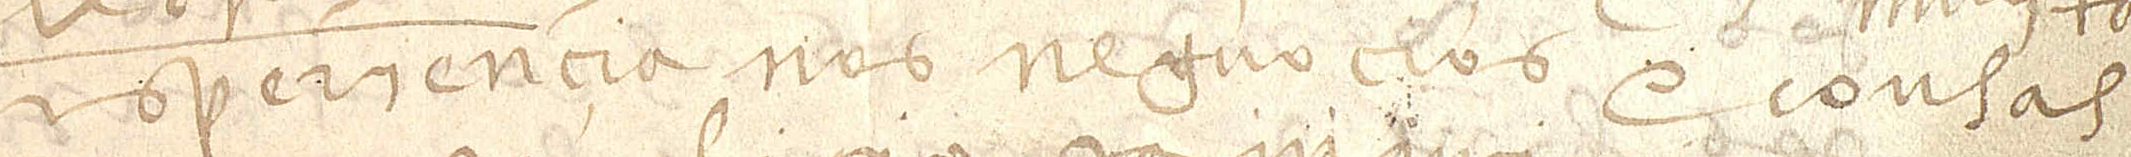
esperyencia nos neguocios e cousas
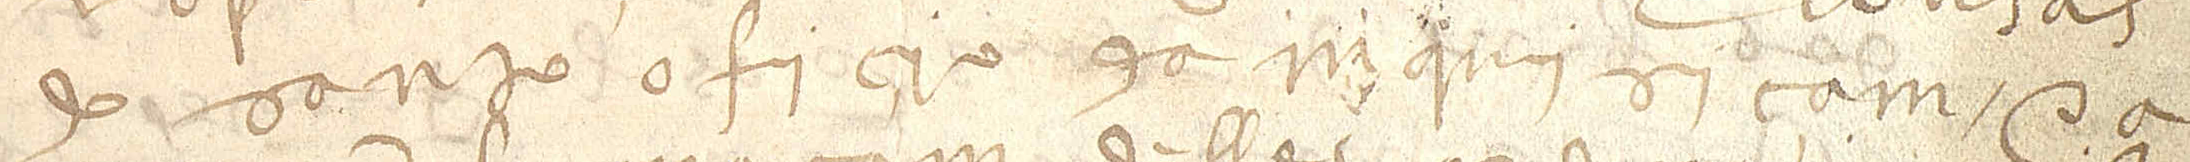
do santo ofycyo da inquysyçam / e a
